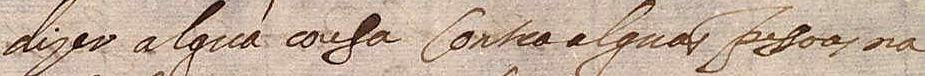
dizer alguā cousa Contra alguas̄ pessoas na
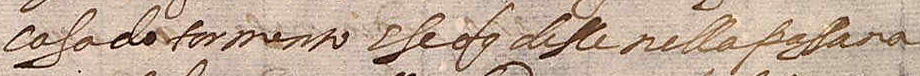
casa do tormento E se o q̄ disse nella passa na
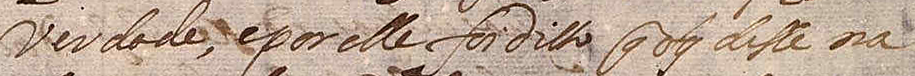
verdade, e por elle foi ditto q̄ o q̄ disse na
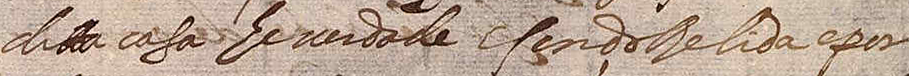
ditta casa he uerdade E sendo lhe lida e por
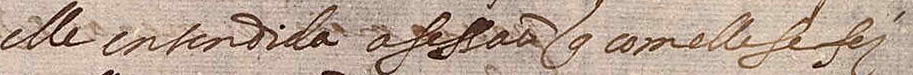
elle entendida a sessão q̄ com elle se fez̄
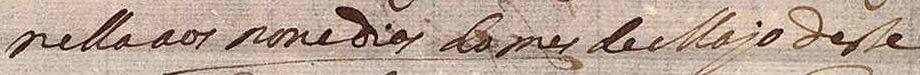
nella aos noue dias do mes de Majo deste
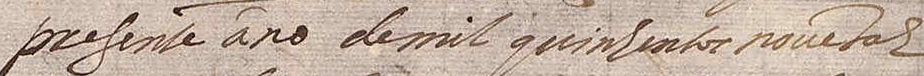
presente āno de mil quinhentos nouēta E
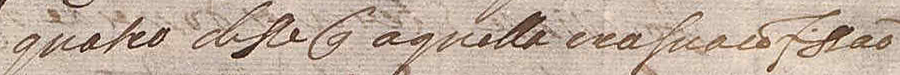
quatro disse q̄ aquella era sua cōfissão
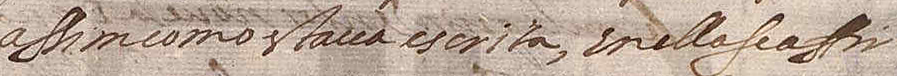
assim como estaua escrita, E nella se affir
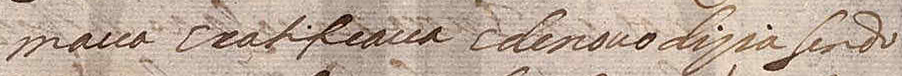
maua E ratificaua E de nouo dizia sendo
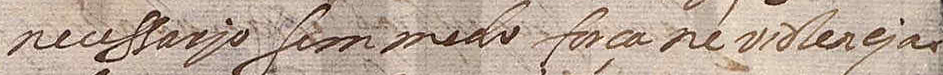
necessarjo sem medo força nē violencja
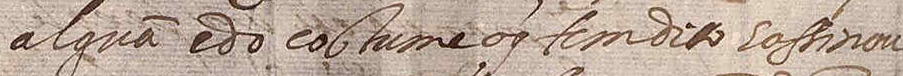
alguā e do costume o q̄ tem ditto E assinou
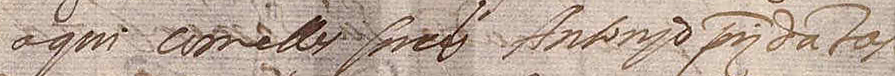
aqui com elles snres̄ Antonjo p̄iz dātas
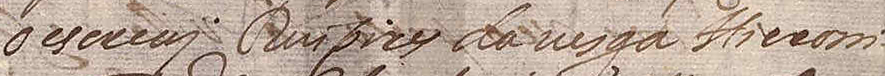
o escreuj Rui pires da ueiga Hieroni
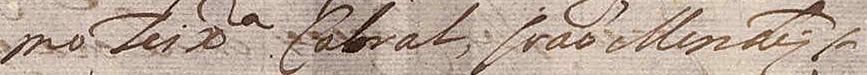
mo Teixra Cabral, Joaõ Mend̄ez /.
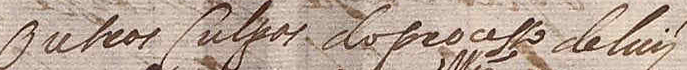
Outras Culpas do processo de luiz̄
